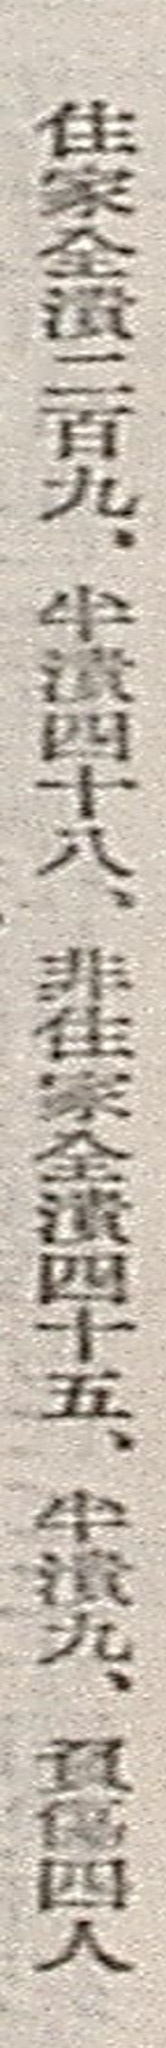住家全潰二百九、半潰四十八、非住家全潰四十五、半潰九、負傷四人
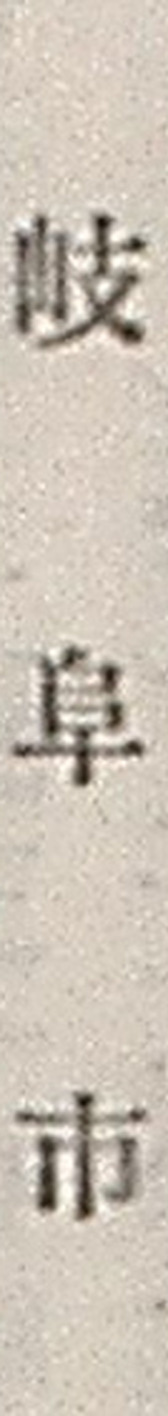岐阜市
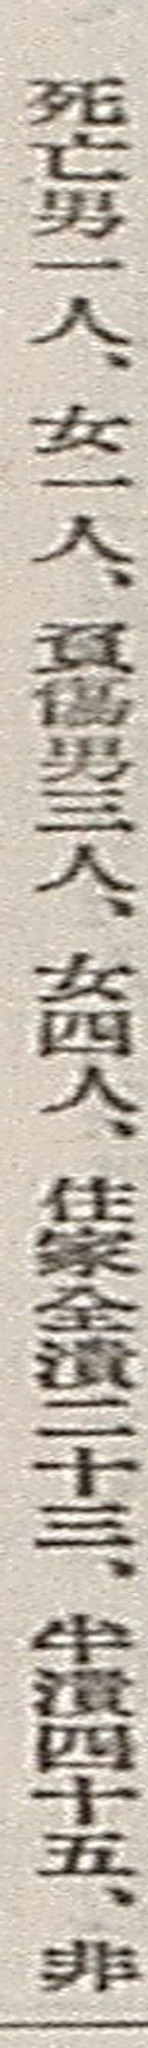死亡男一人、女一人、負傷男三人、女四人、住家全潰二十三、半潰四十五、非
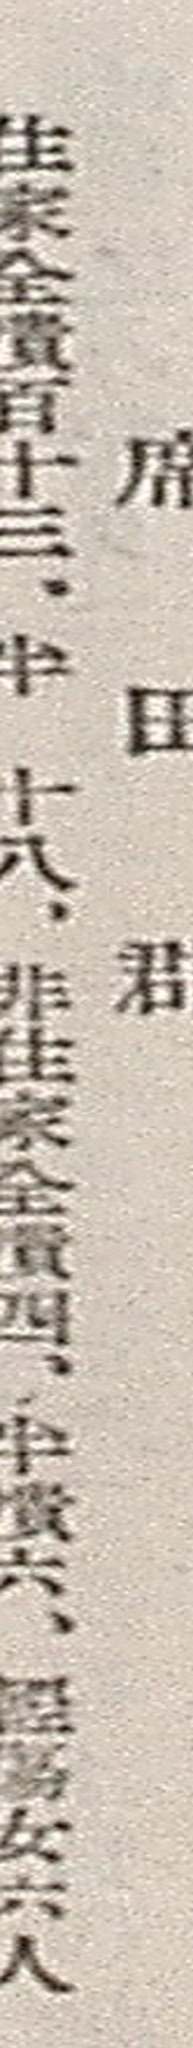住家全潰百十三、半十八、非住家全潰四、半潰六、軽傷女六人
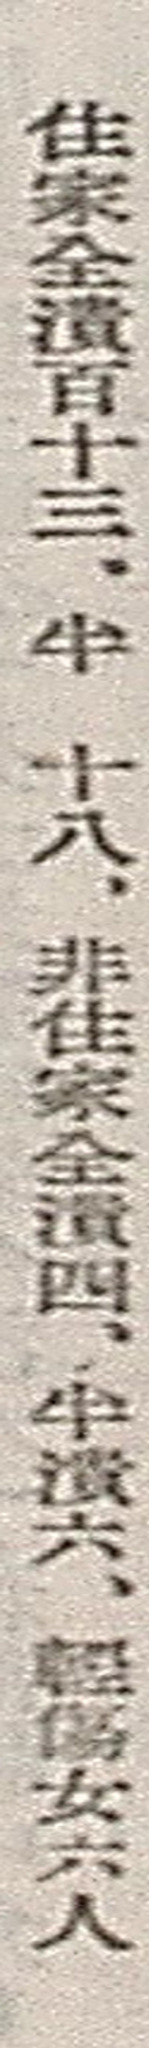住家全潰百十三、半十八、非住家全潰四、半潰六、軽傷女六人
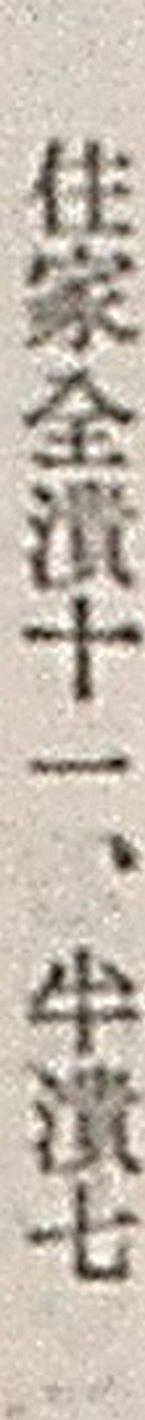住家全潰十一、半潰七
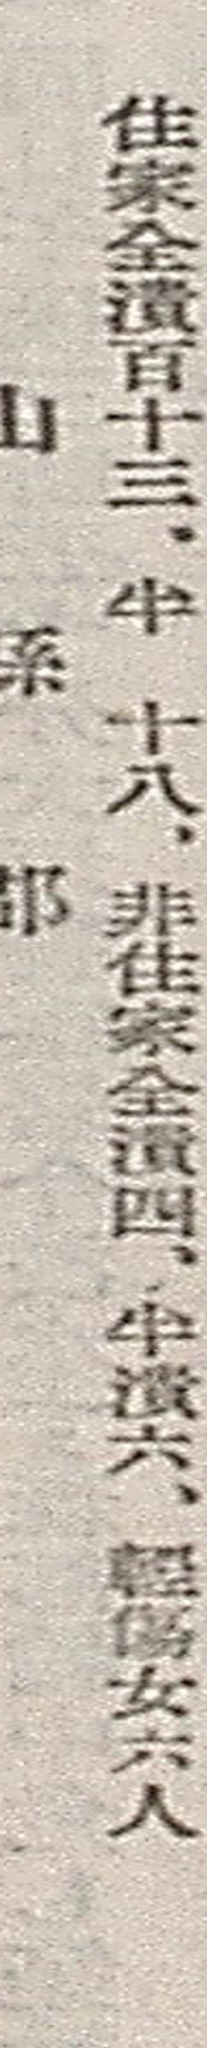住家全潰百十三、半十八、非住家全潰四、半潰六、軽傷女六人
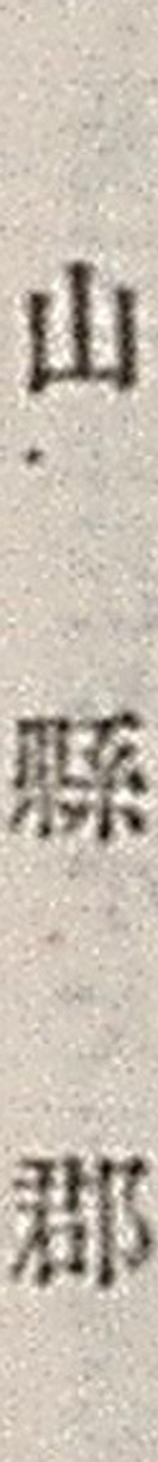山縣郡
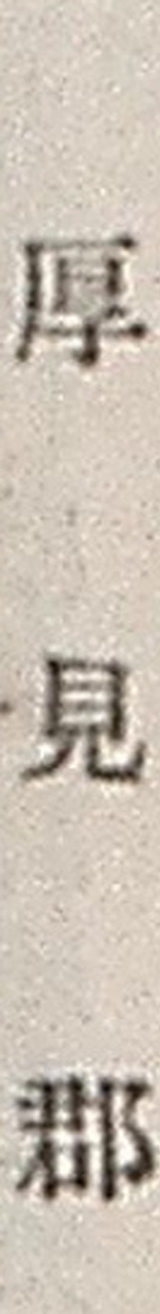厚見郡
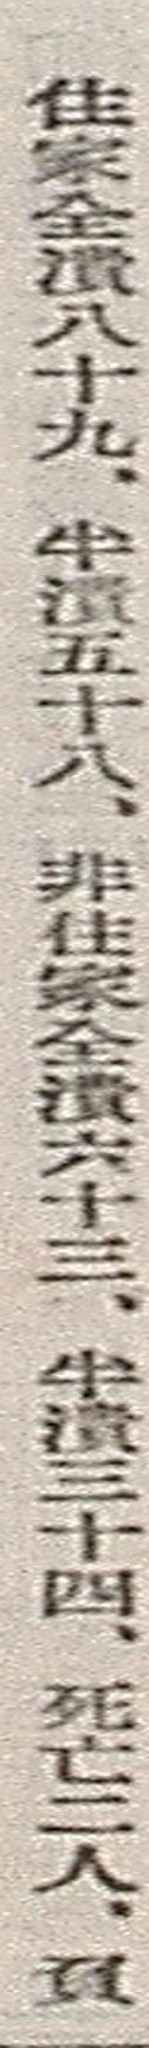住家全潰八十九、半潰五十八、非住家全潰六十三、半潰三十四、死亡二人、負
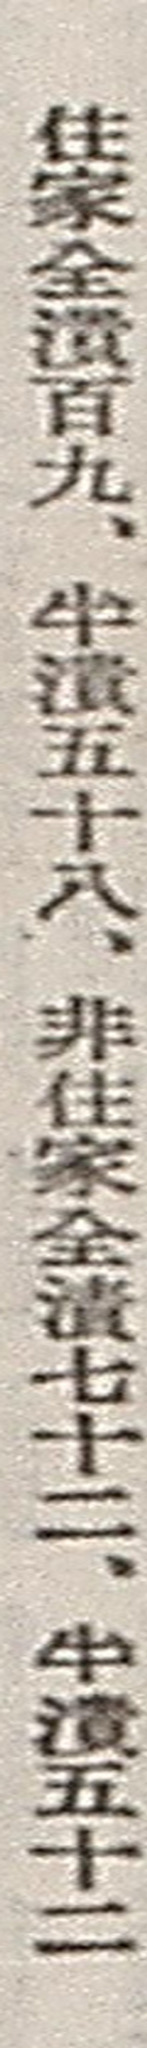住家全潰百九、半潰五十八、非住家全潰七十二、半潰五十二
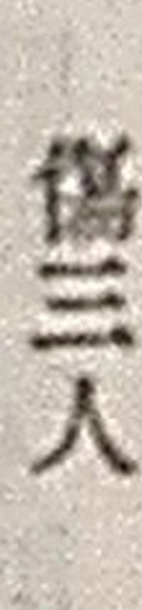傷三人
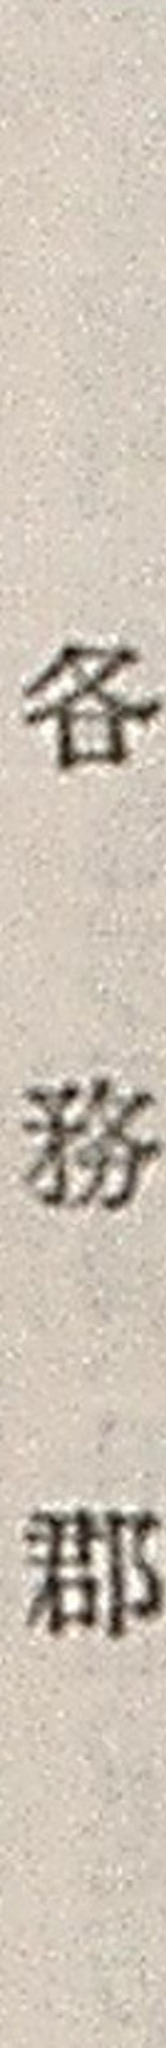各務郡
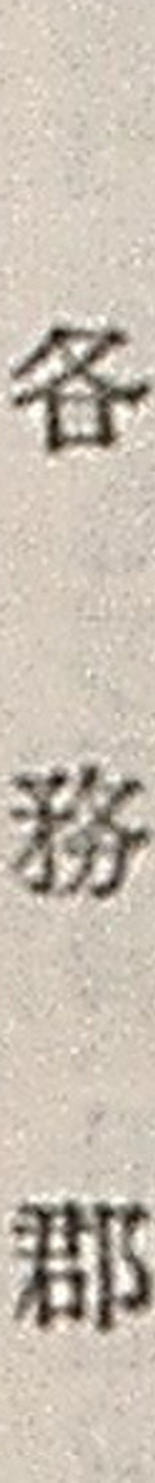各務郡
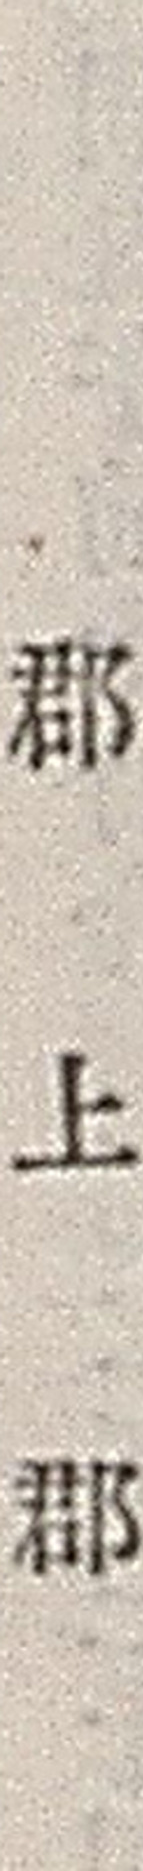郡上郡
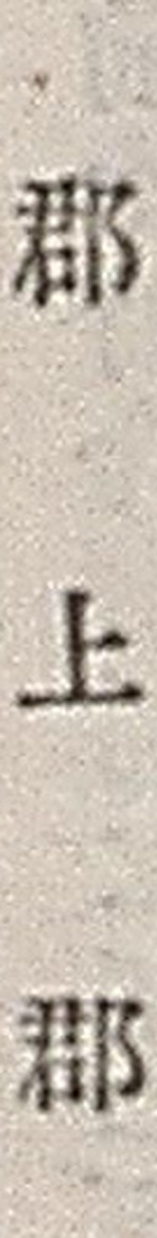郡上郡
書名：風俗畫報臨時増刊第百二十六號　洪水被害録（中）
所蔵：東京大学地震研究所図書室 Earthquake Research Institute Library, The University of Tokyo, JAPAN
